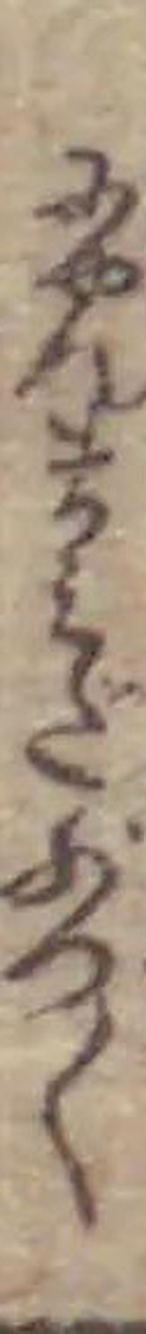にゃんまみだぶつ〳〵
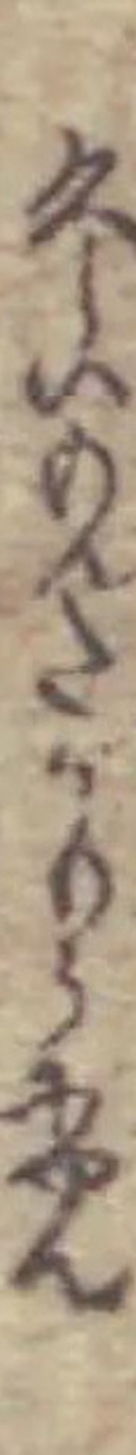久しいもんたがもうにやん
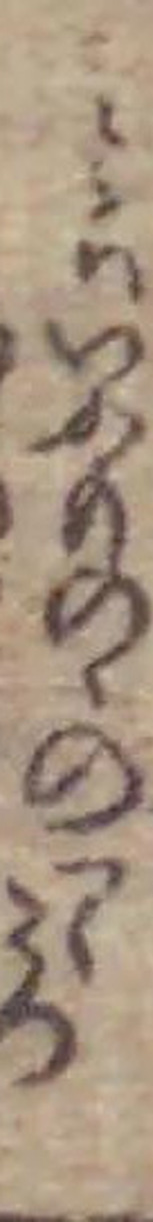はいふものゝのアヽうつ
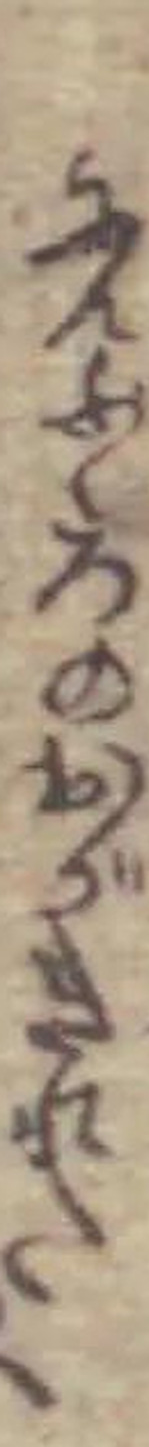にんふくろのおがきれた
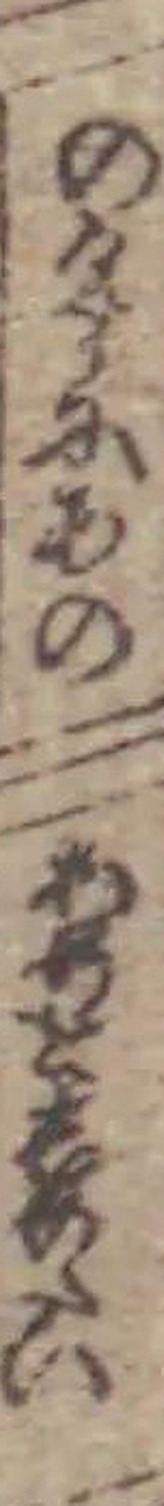のるすにあのあめをしめたい
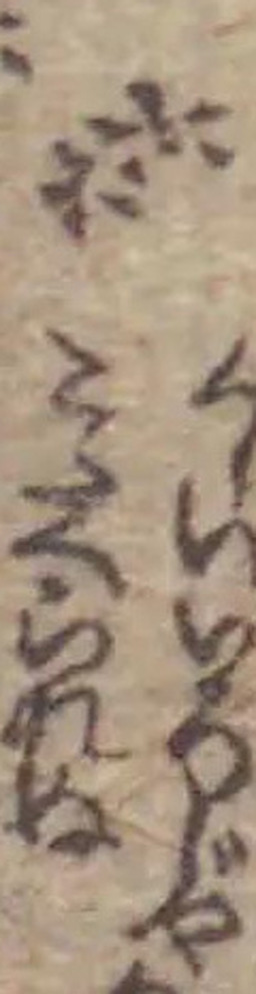こたへられぬ
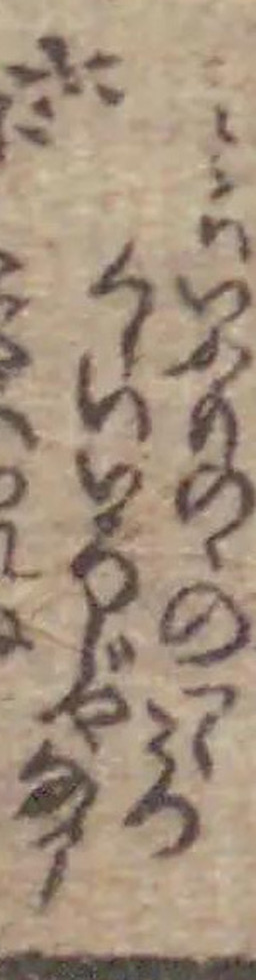くしいいろじやなア
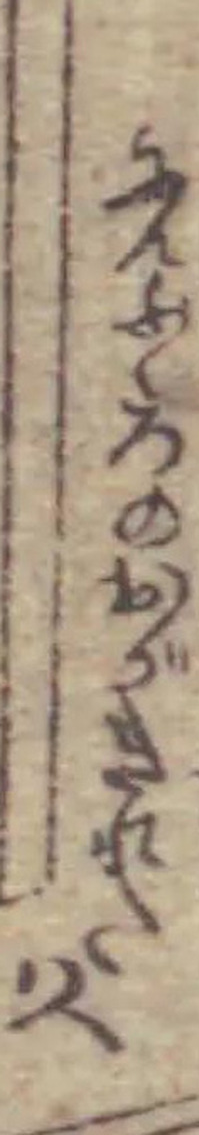にんふくろのおがきれた
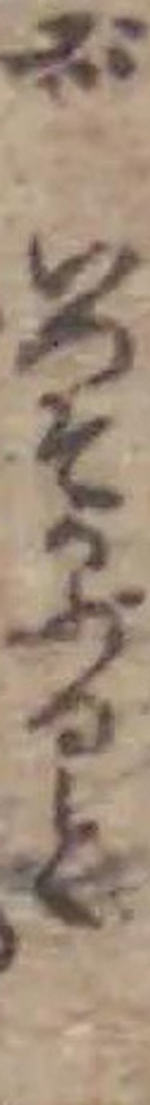いつそかぶると
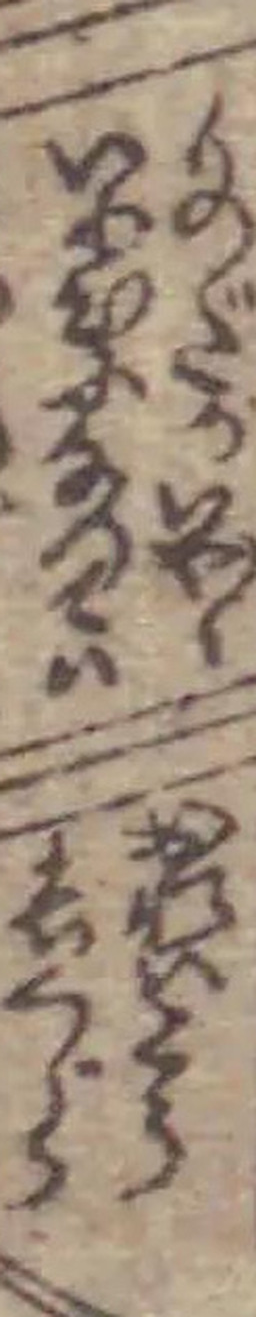いふ心になつてはしくじり
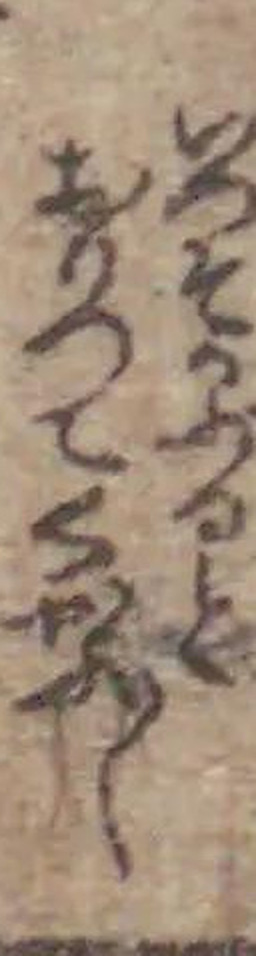おもつてくおふ〳〵
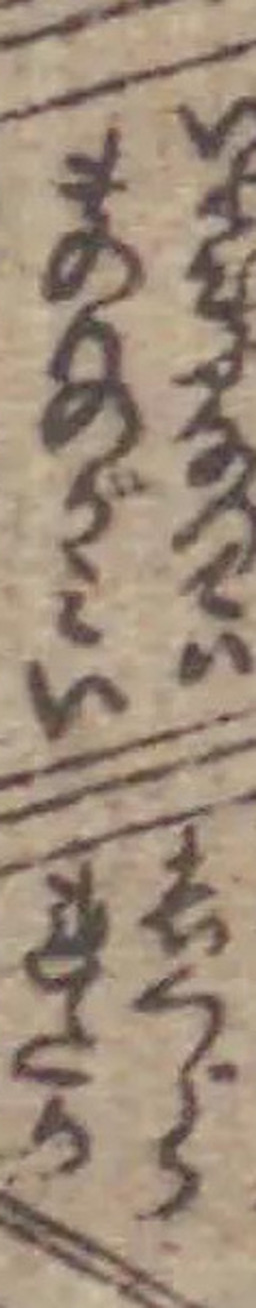まのものがみいれたか

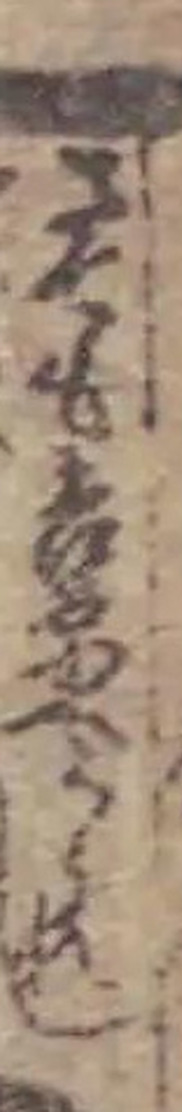さても吉原へうられし
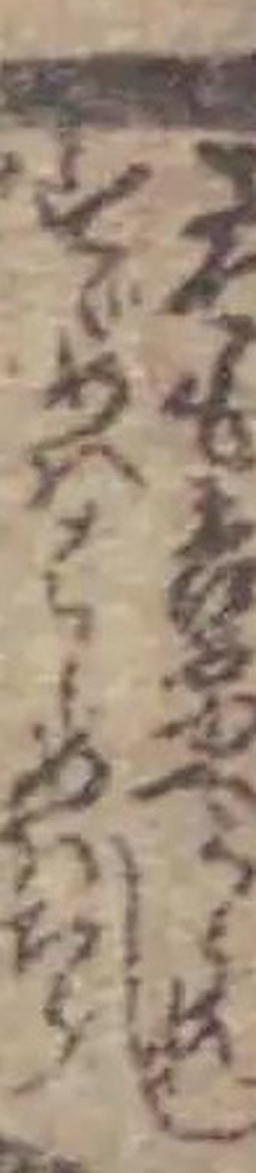すゞめははしめはちう
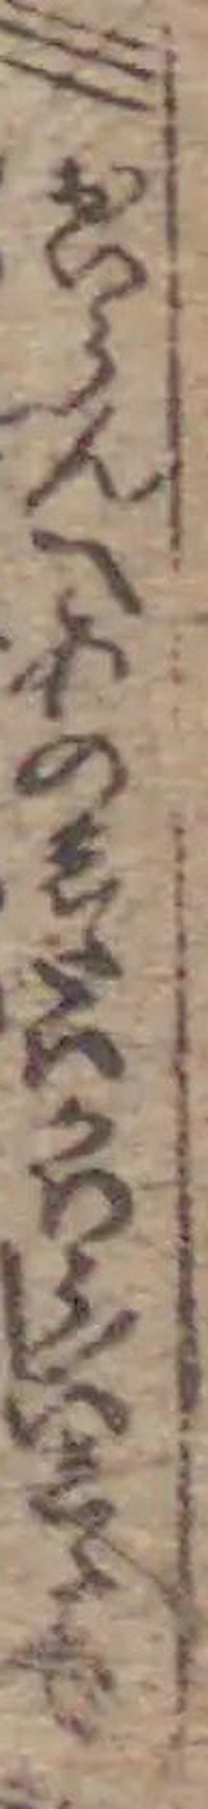おいらんへあのしたはかはらしいしたで
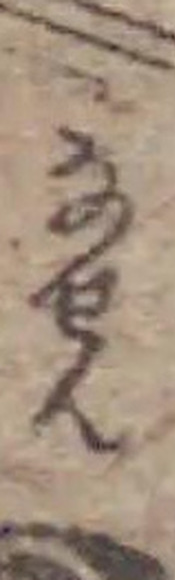なせん
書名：冷水灰毛猫 2巻
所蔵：国立国会図書館 National Diet Library, JAPAN
